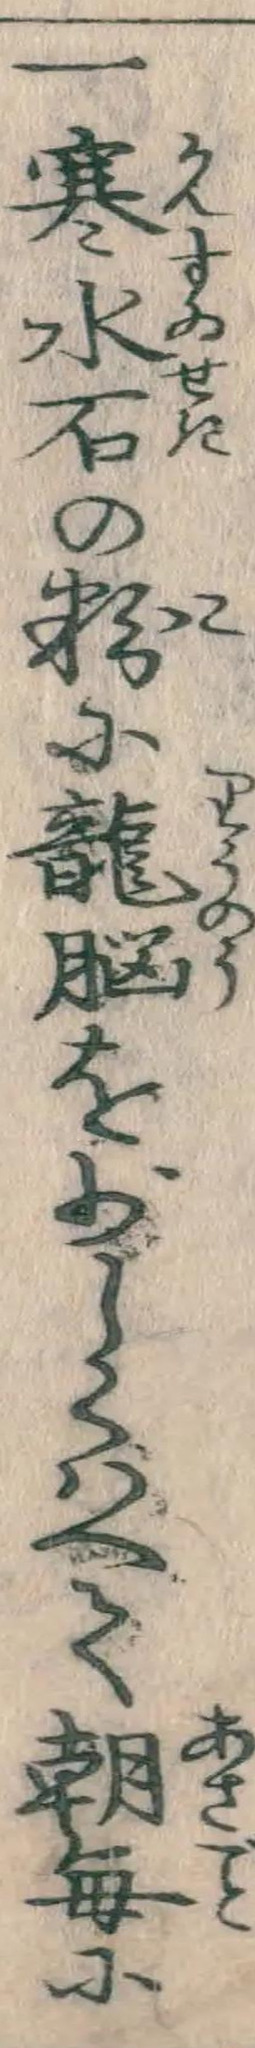一寒水石の粉に竜脳を少しくはへて朝毎に
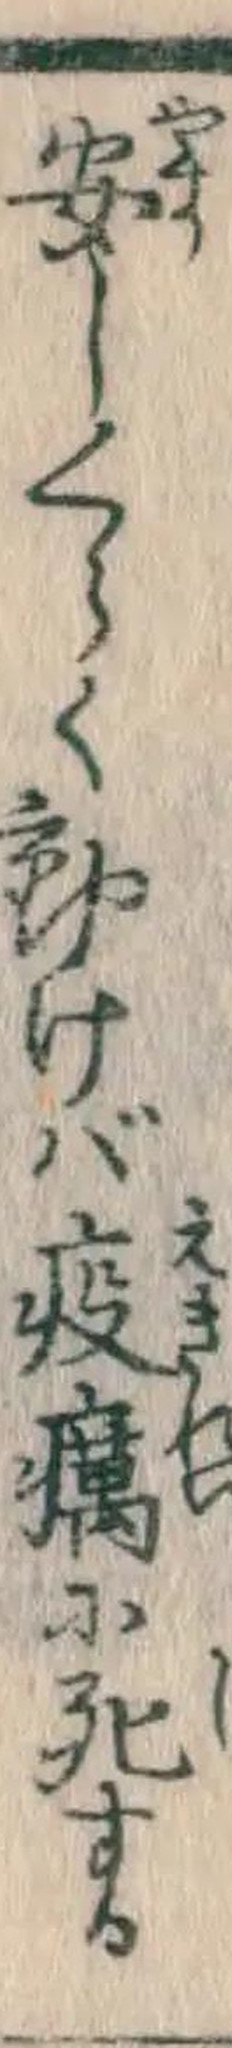安しくらく動けば疫癘に死する
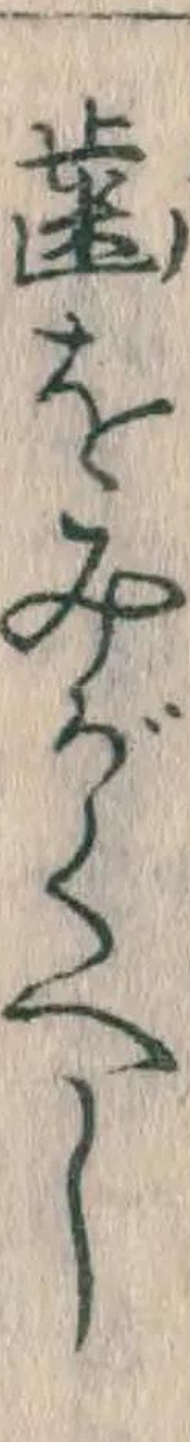歯をみがくへし
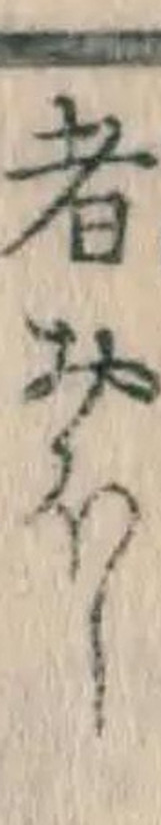者おほし
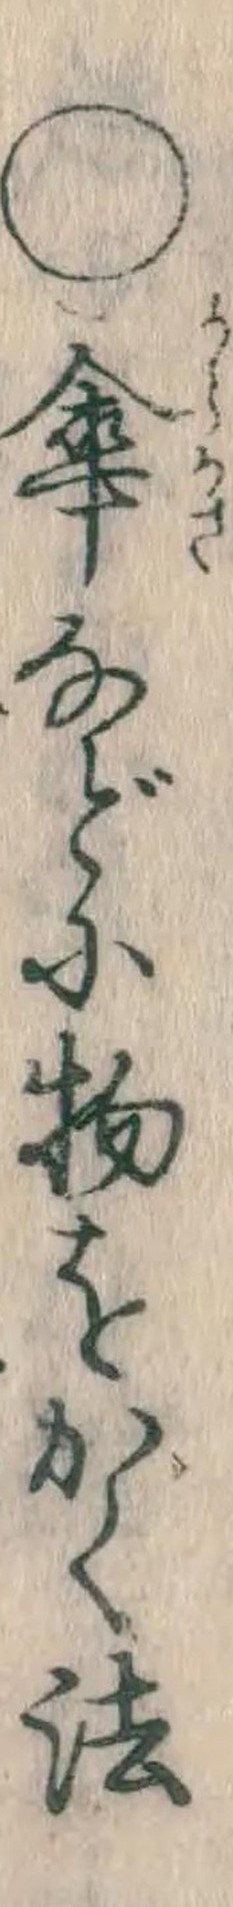○傘などに物をかく法
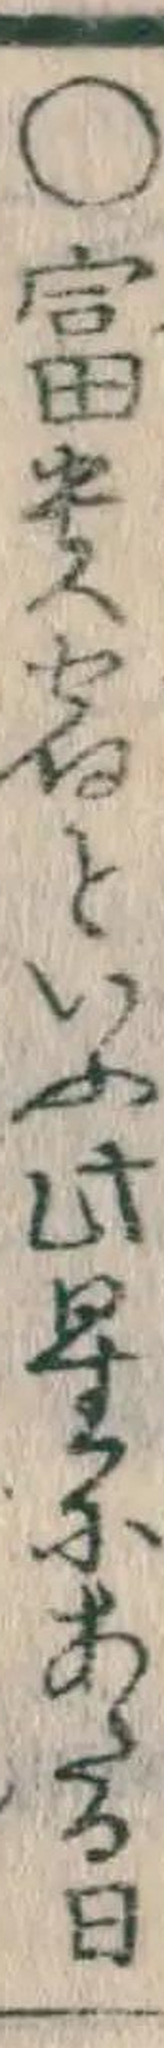○富貴宿といふ此星にあたる日
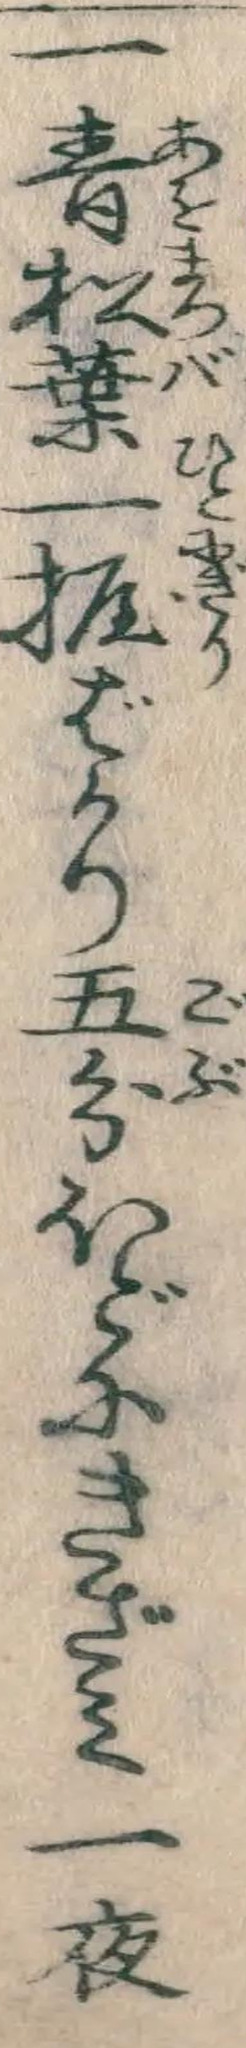一青松葉一握ばかり五分ほどにきざみ一夜
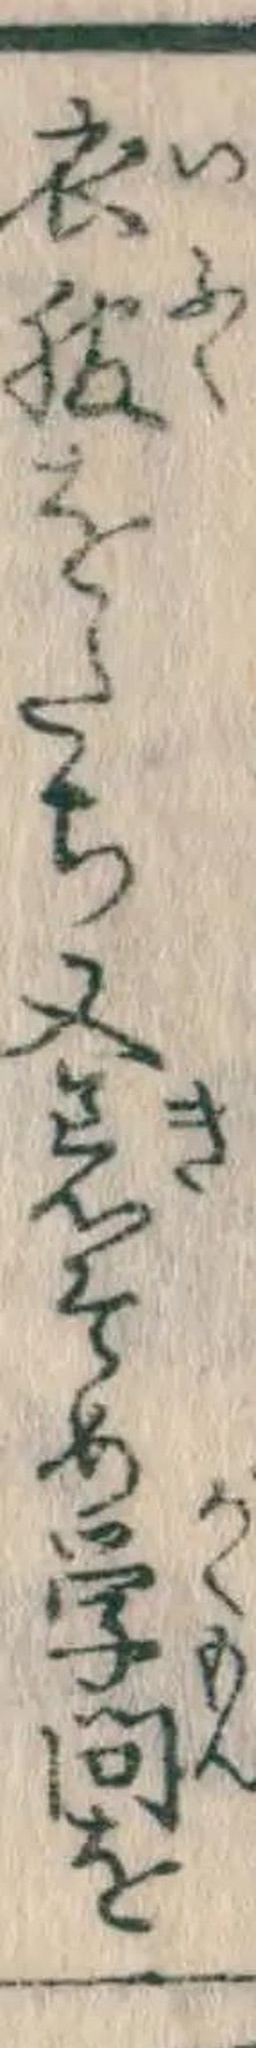衣服をたち又着そめ学問を
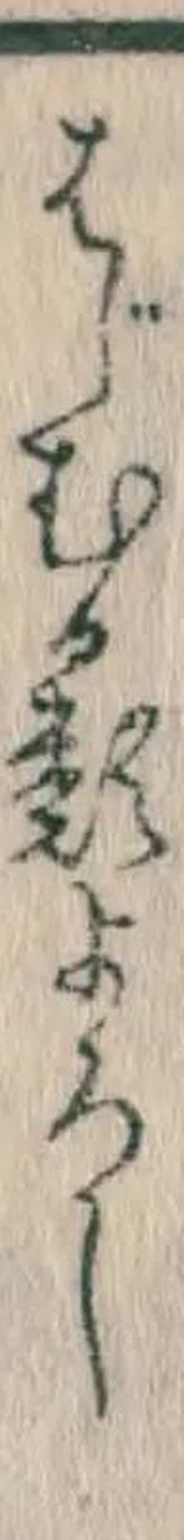はじむる類よろし
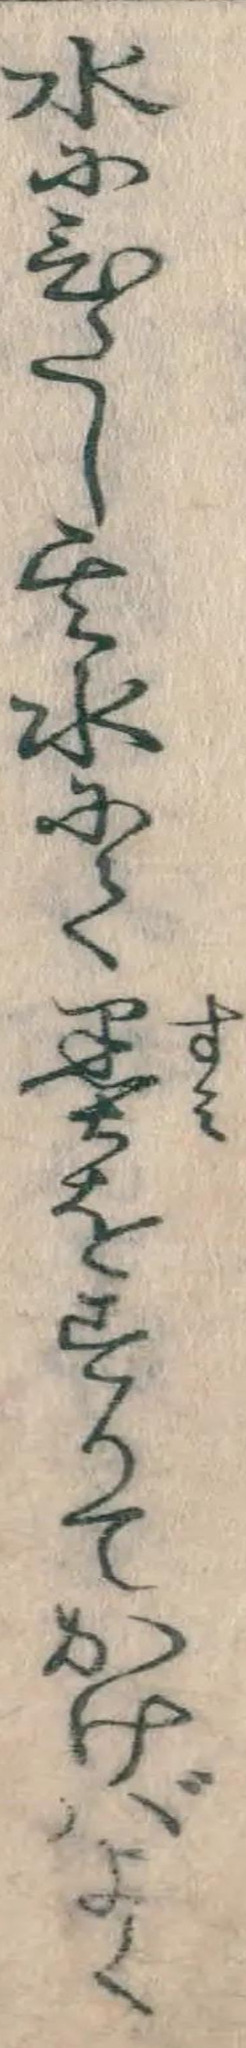水にひたし其水にて墨をすりてかけばよく
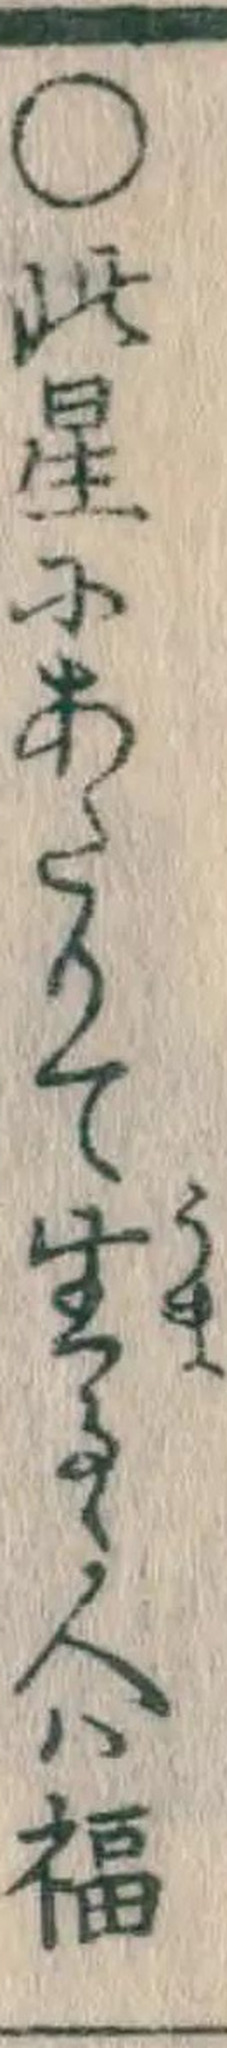○此星にあたりて生るゝ人は福
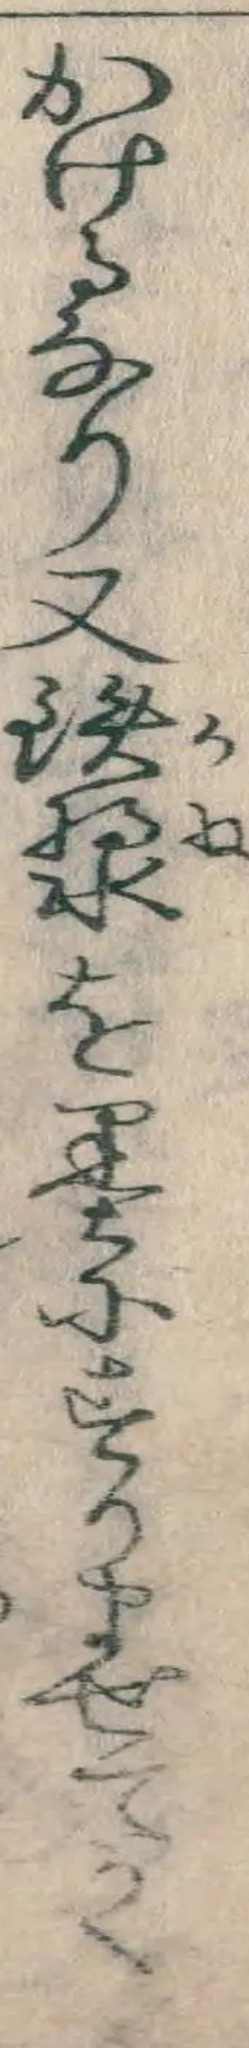かけるなり又鉄漿を墨にすりませてかく
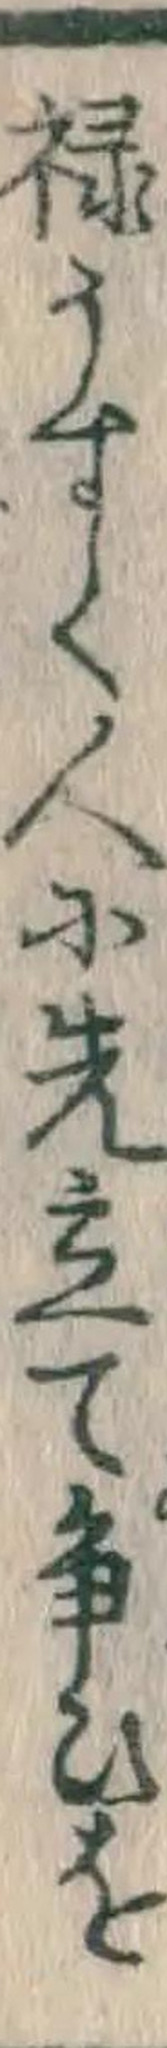禄うすく人に先立て争ひを
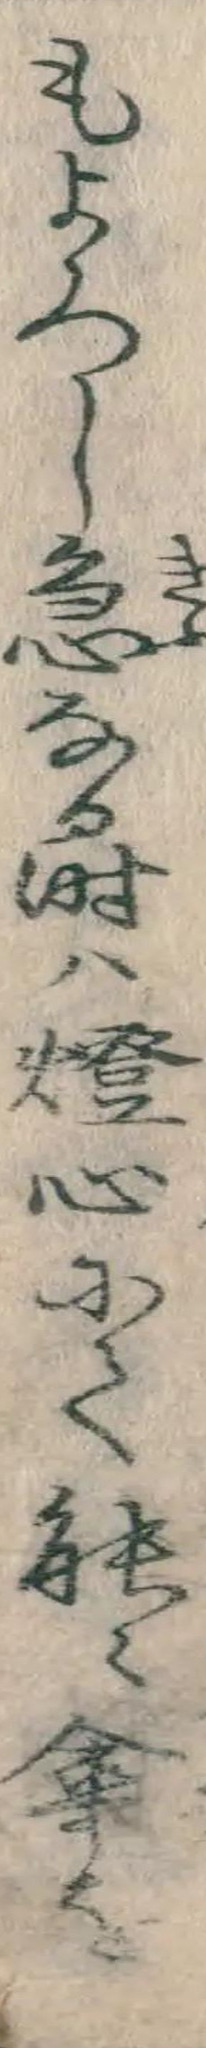もよろし急なる時は燈心にて能々傘を
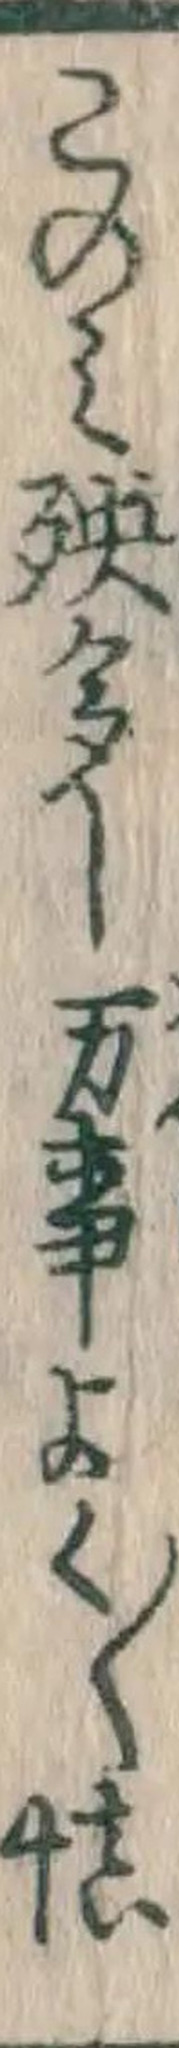このみ殃多し万事よく〳〵慎
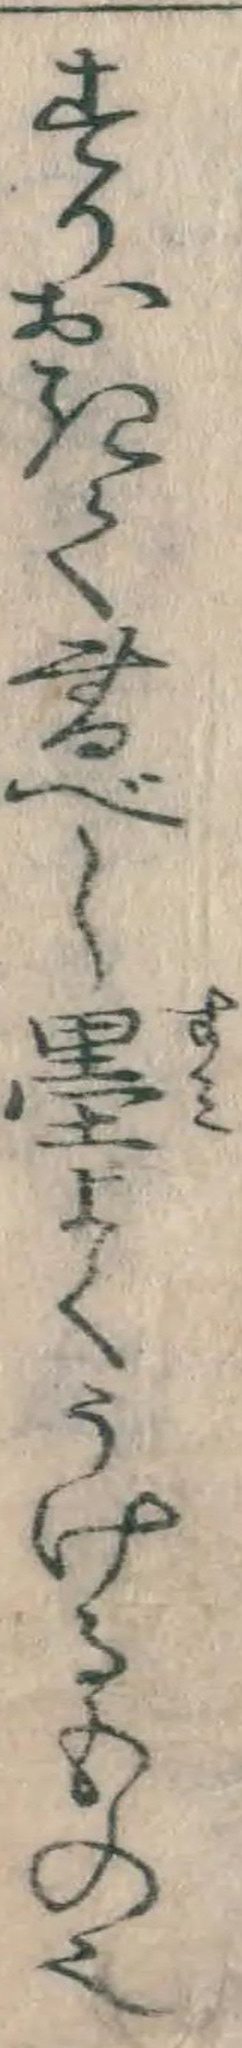すりおきて書べし墨よくうけるもの也
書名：広益秘事大全 3巻. [2]
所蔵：国立国会図書館 National Diet Library, JAPAN
